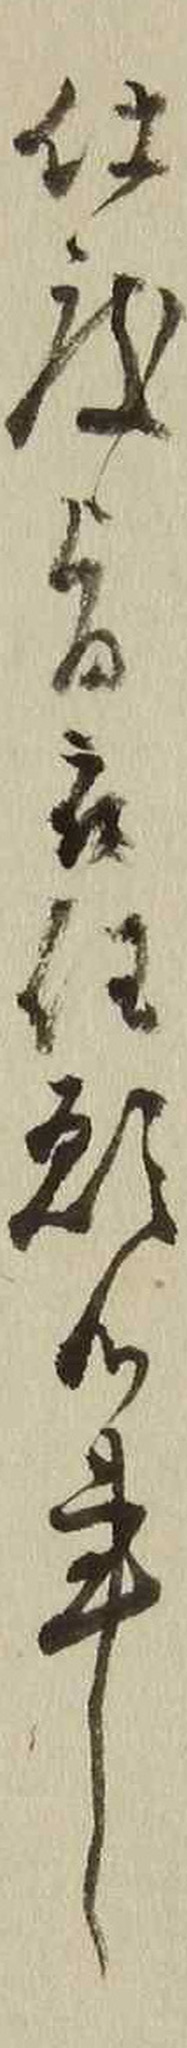仕度旨被任願候事
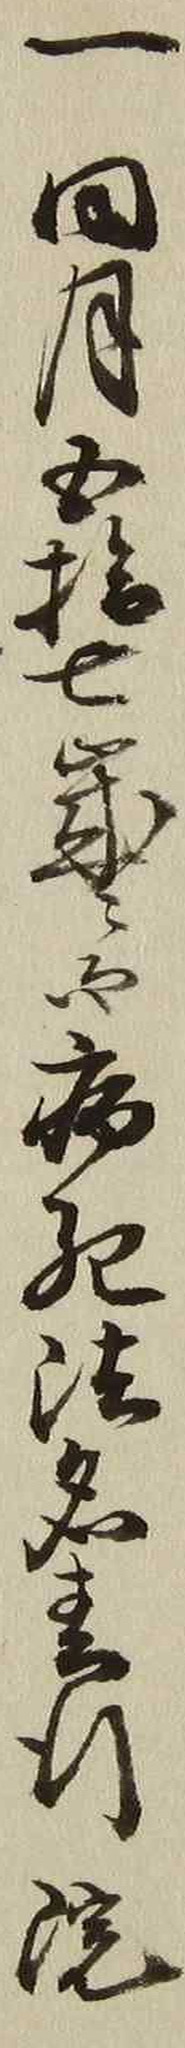一四月五拾七歳に而病死法名春行院
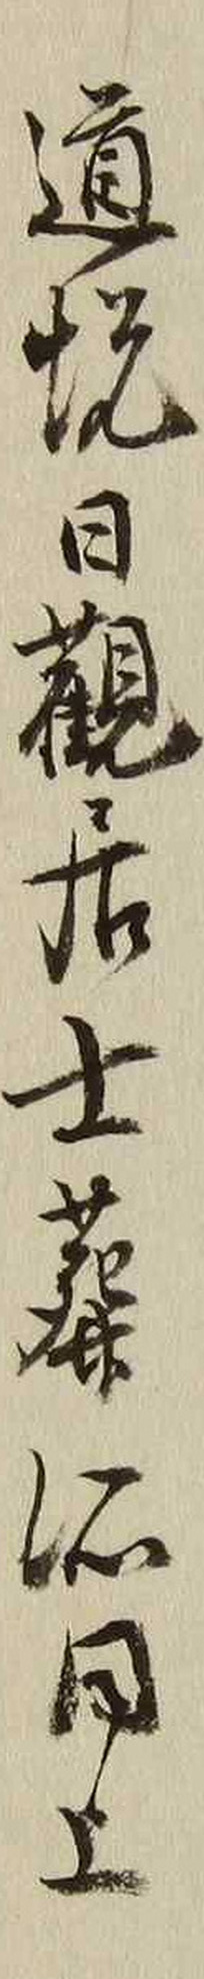道悦日観居士葬所同上
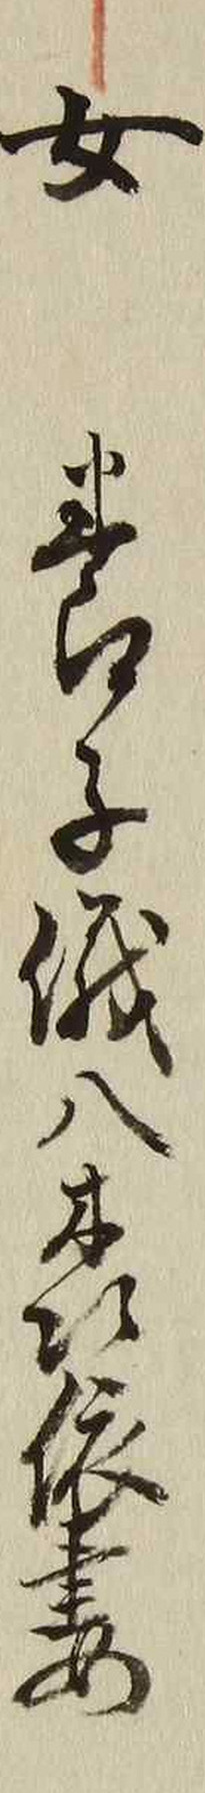女養子儀八森依妻
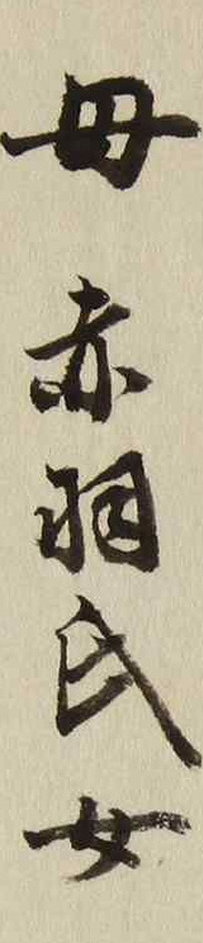母赤羽氏女
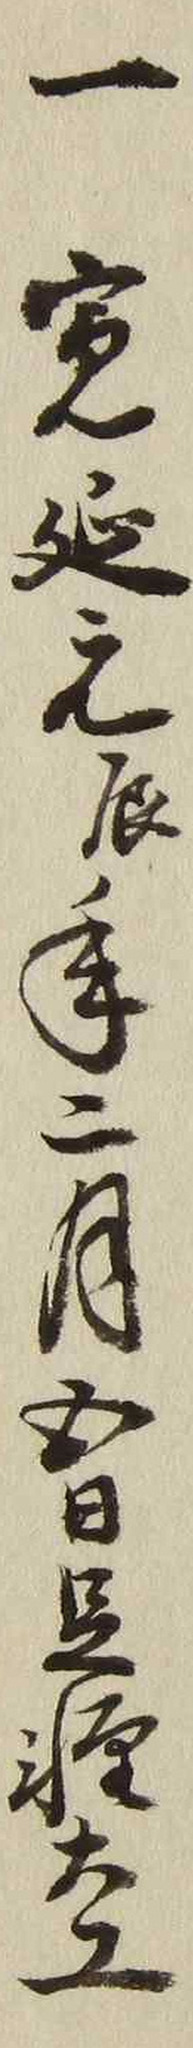一寛延元辰年二月五日足軽大工
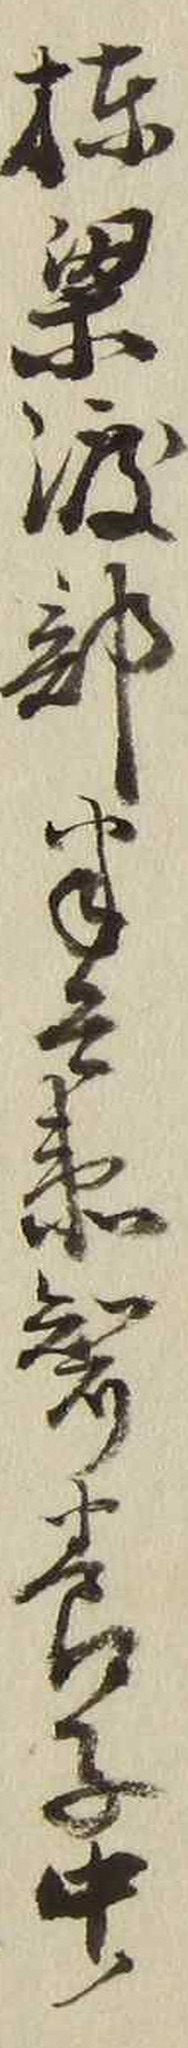棟梁渡部半兵衛聟養子中ノ
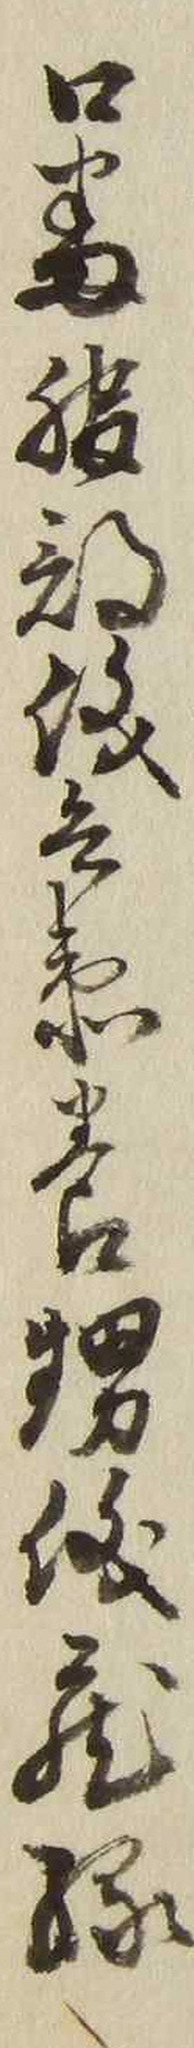口番服部儀兵衛養甥儀蔵縁

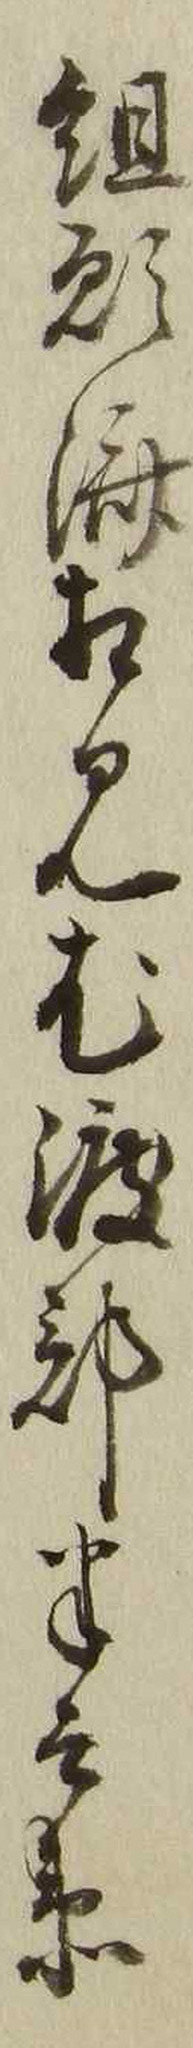組頭済相見尤渡部半兵衛
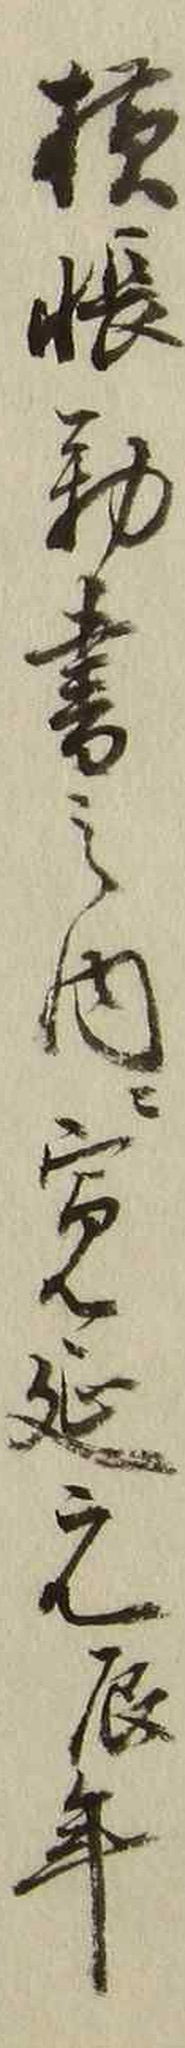横帳勤書之内に寛延元辰年
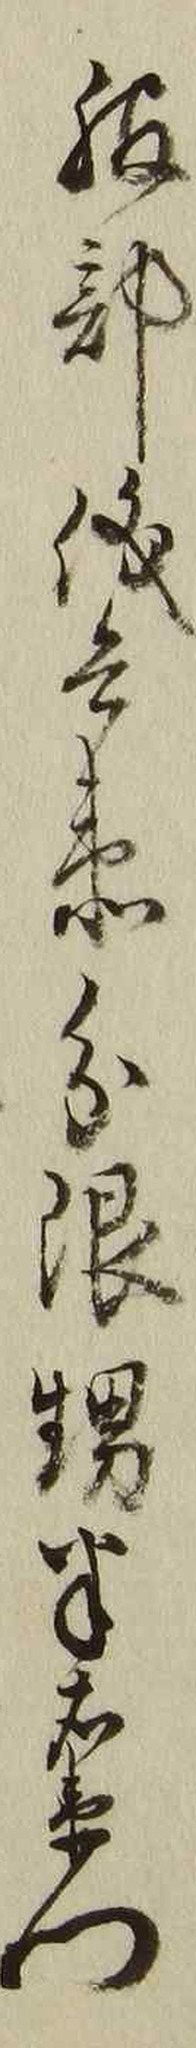服部儀兵衛分限甥半右衛門
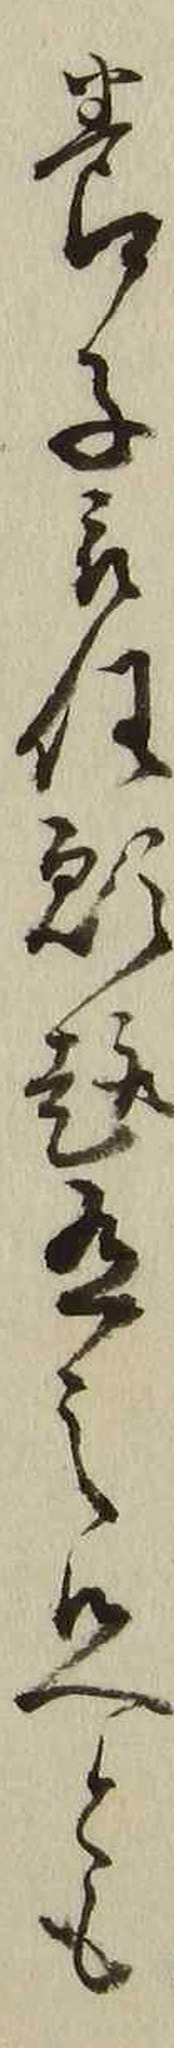養子被任願趣有之候とも
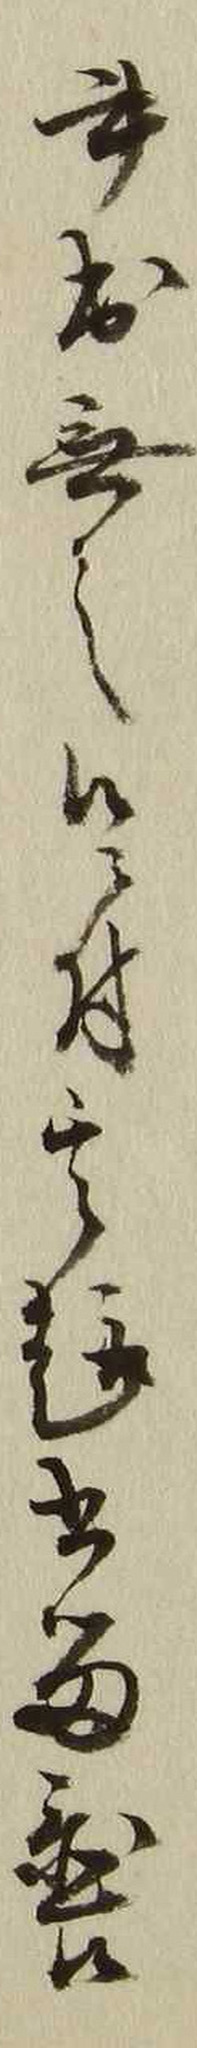書出無之候に付其趣書留置候
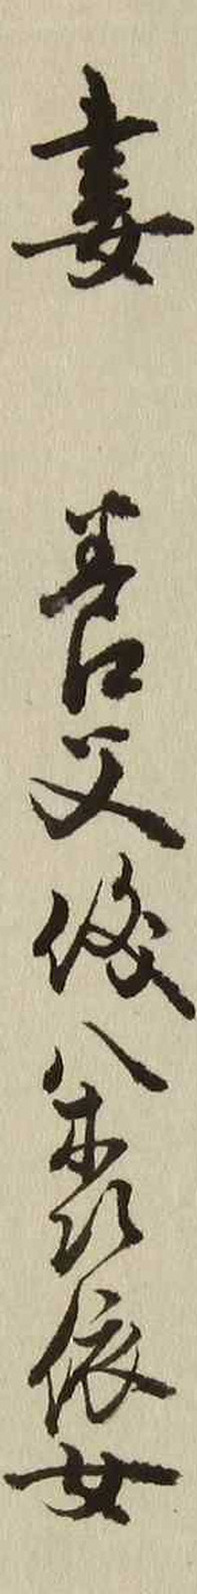妻養父儀八森依女
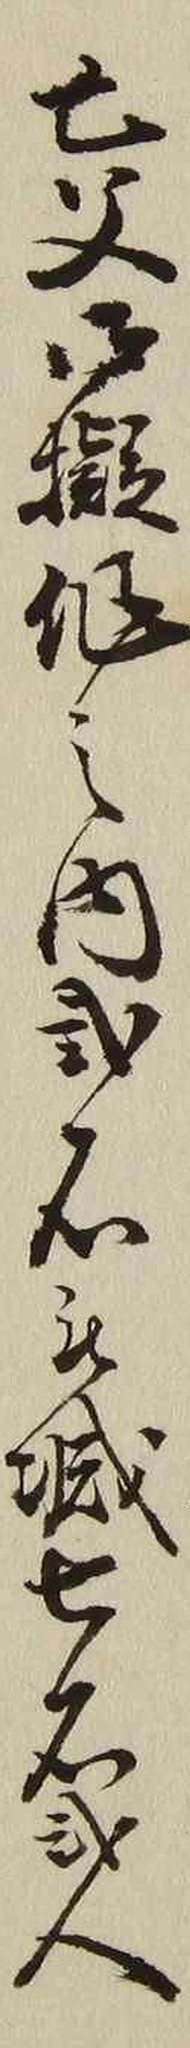亡父御擬作之内弐石被減七石弐人
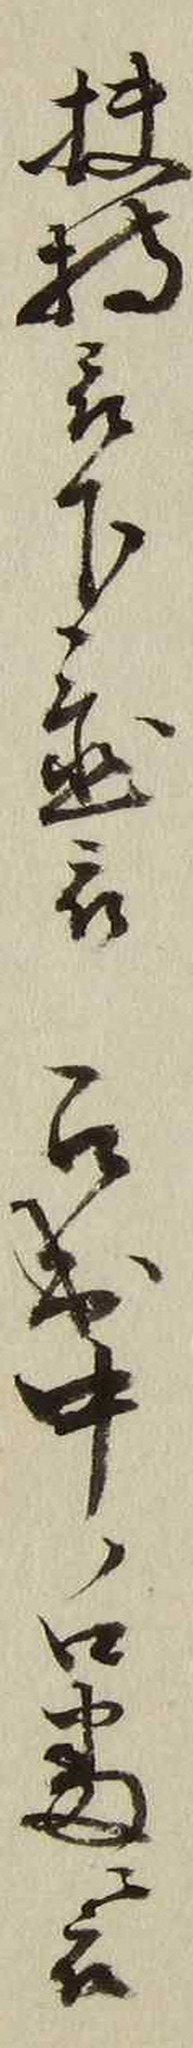扶持被下置被召出中ノ口番に被
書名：諸士系譜　巻之38　は之部6
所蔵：会津若松市立会津図書館
